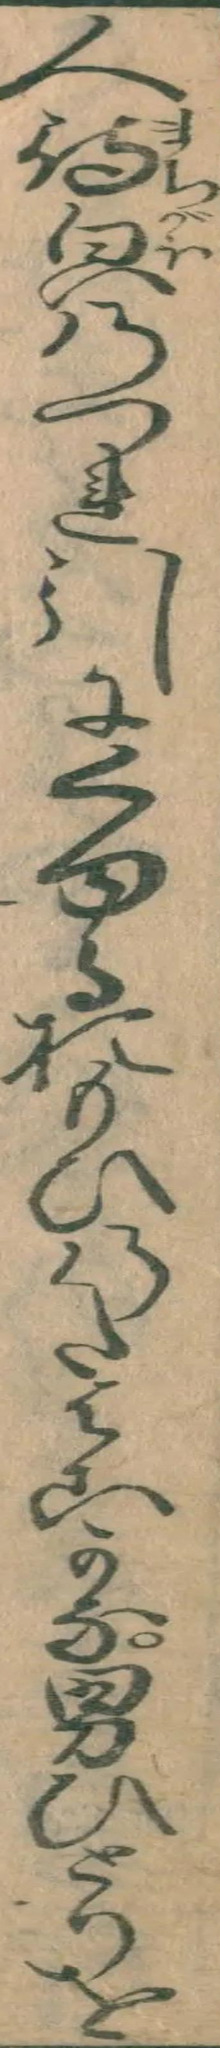人待貌のつれ引にくゆるおもひのたはこかな。男ひとりを
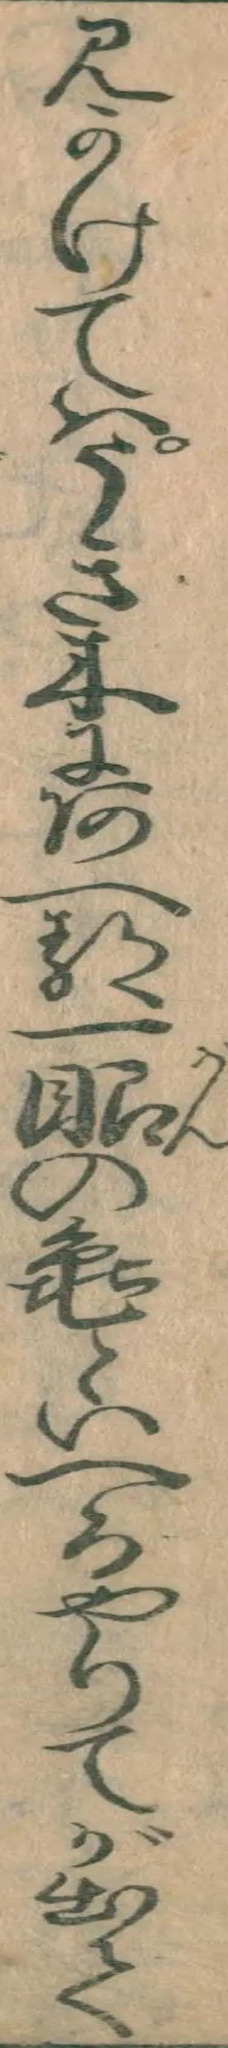見かけては。うき木にあへる一眼の亀といへるやりてが出て
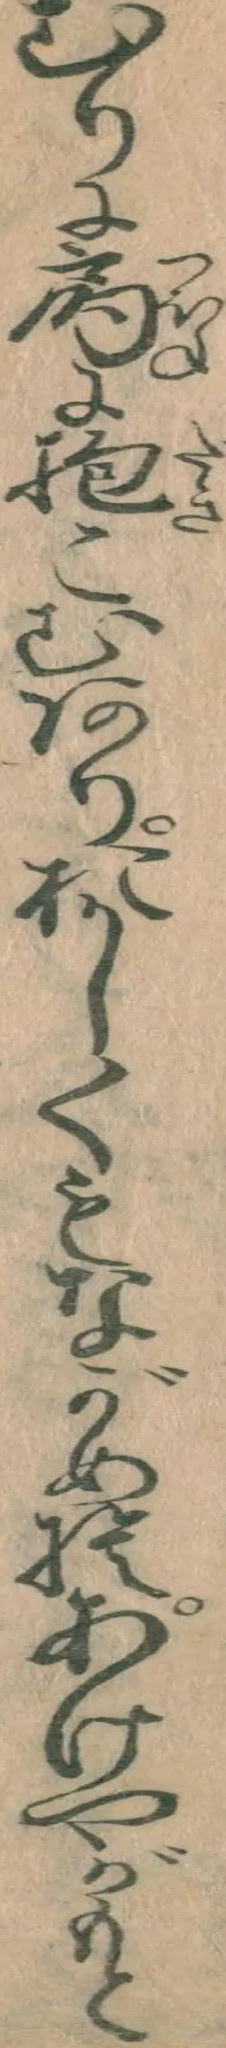むりに局に抱こむあり。おかしくもながめ捨。あけやがもと
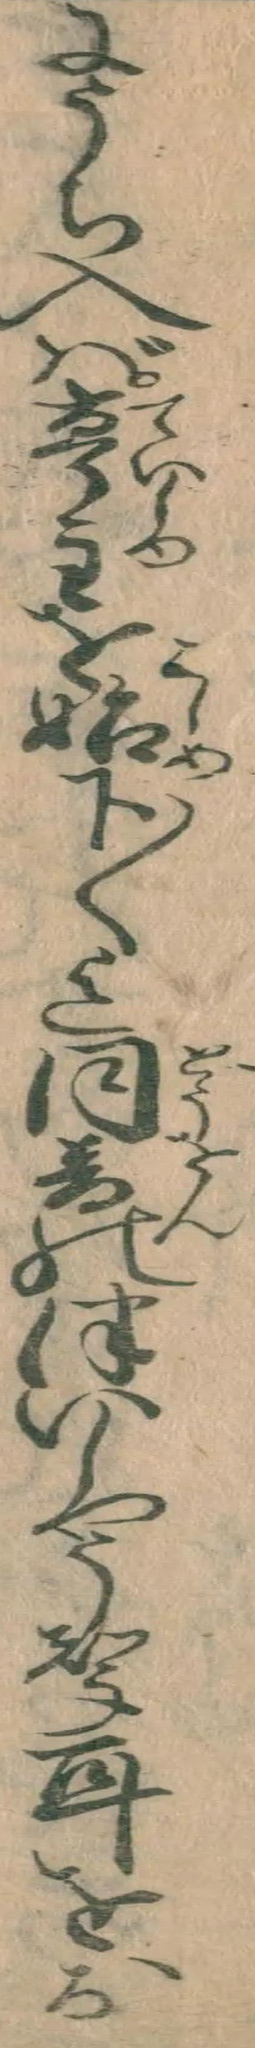にうち入ば。亭主を始下々迄同音のついしやう声耳をお
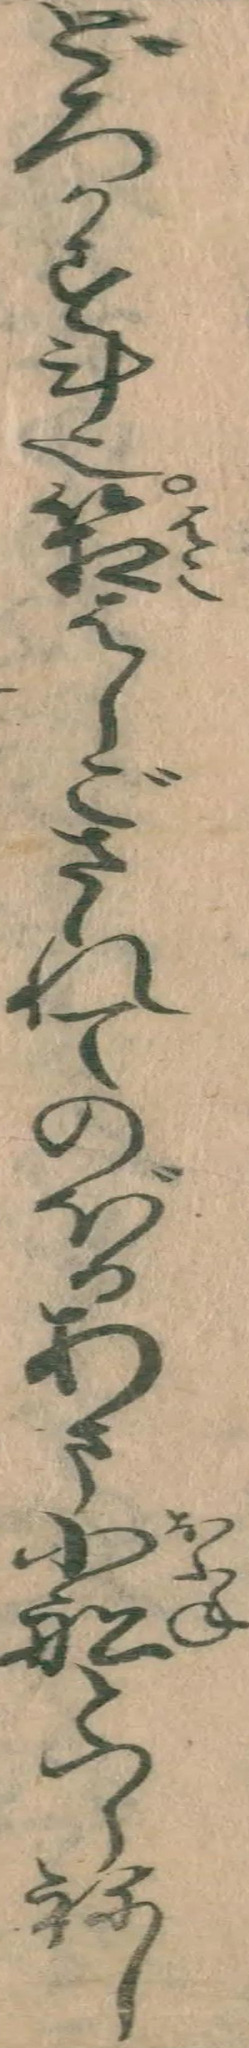どろかす計也、箱はしごさゝれてのぼるあま小船とつらねし
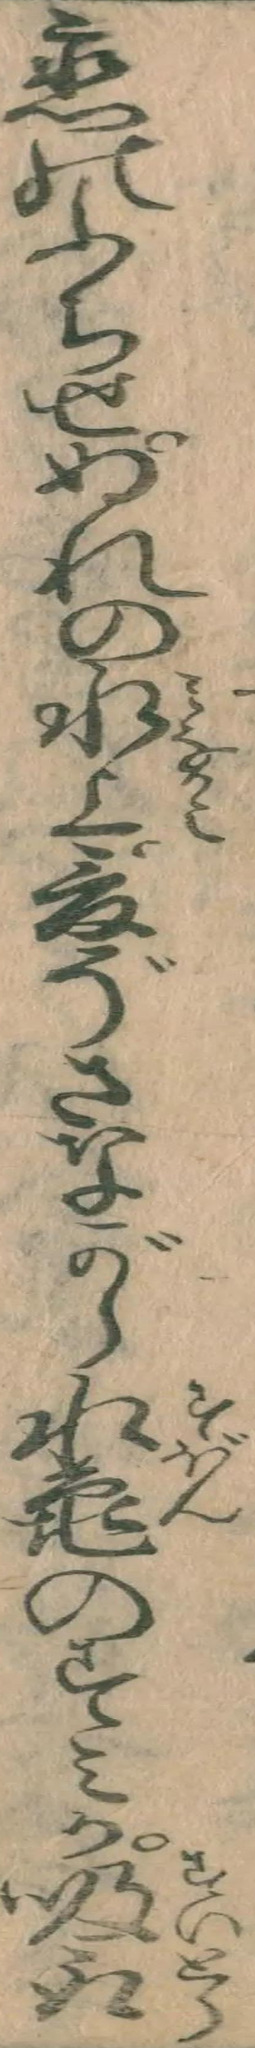恋のふちせ。ぬれの水上。爰ぞさながら水亀のすみか。吸取
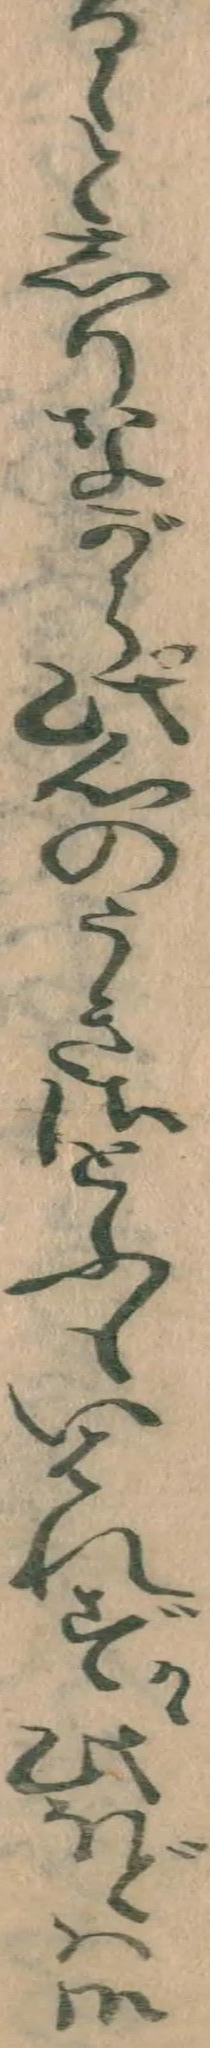るゝとしりながら。此心のうきさとにもいはれずかゝ此ほどは御
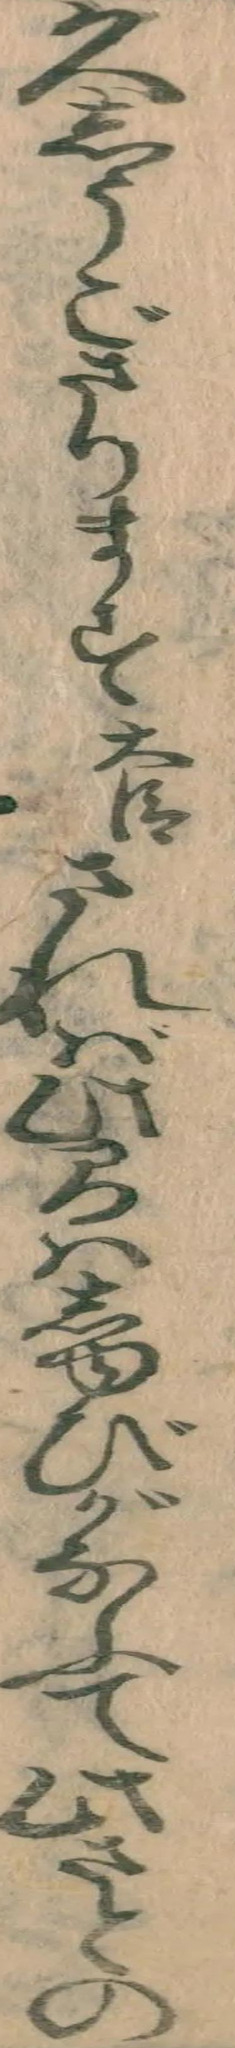久しうごさります大臣されば此間はしゆびがなふて此さとの
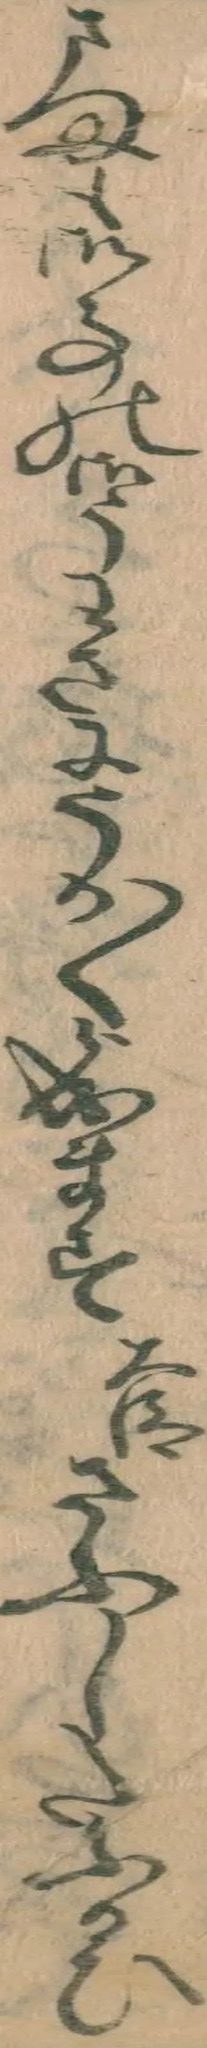さまも御事の御うわさにうか〳〵成ます大臣さふしたふかひ
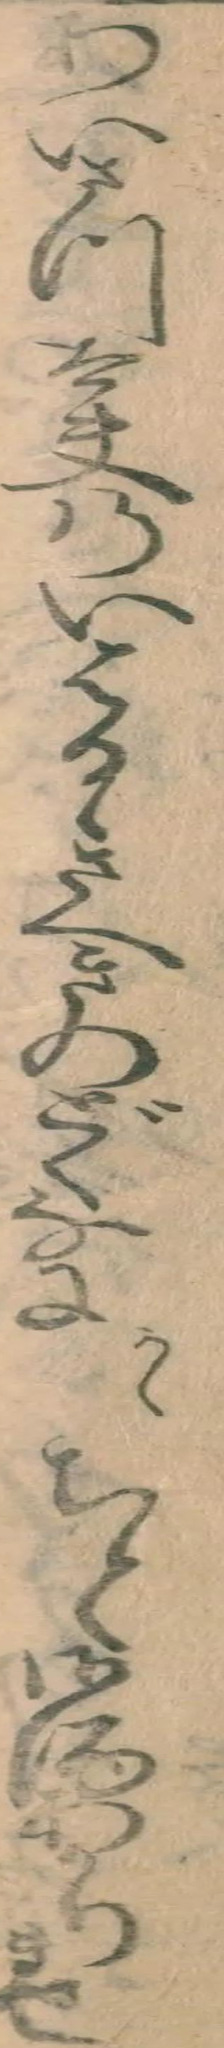あいさつ太夫のいはるゝさへきのどくなにかゝちと御酒あかりませ
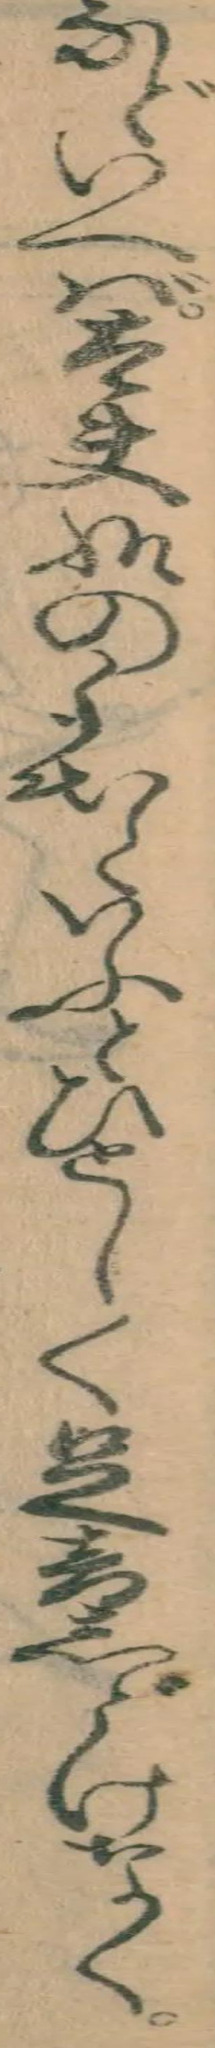などいへば。太夫様の御出といふとひとし〱足音しどけなく。
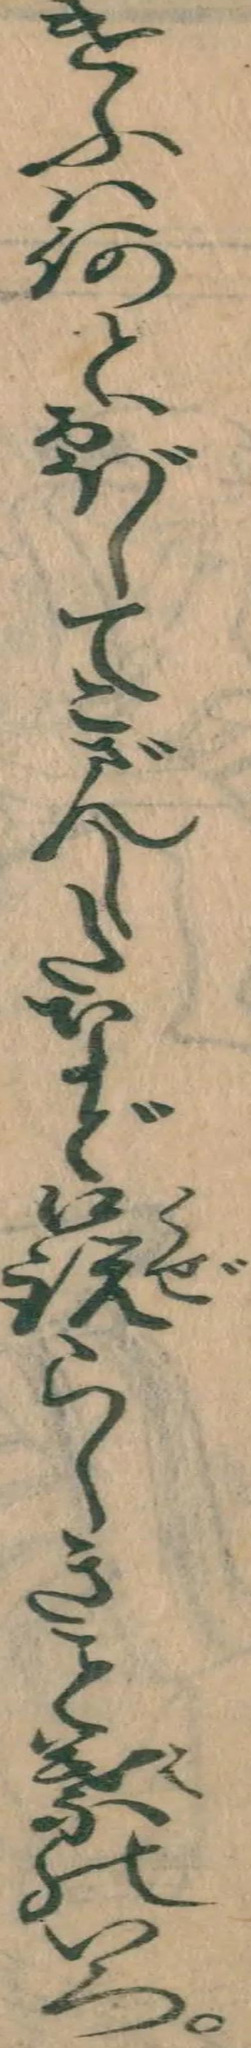けふは何とおぼしてこざんしたなど口説らしきこと葉のいろ。
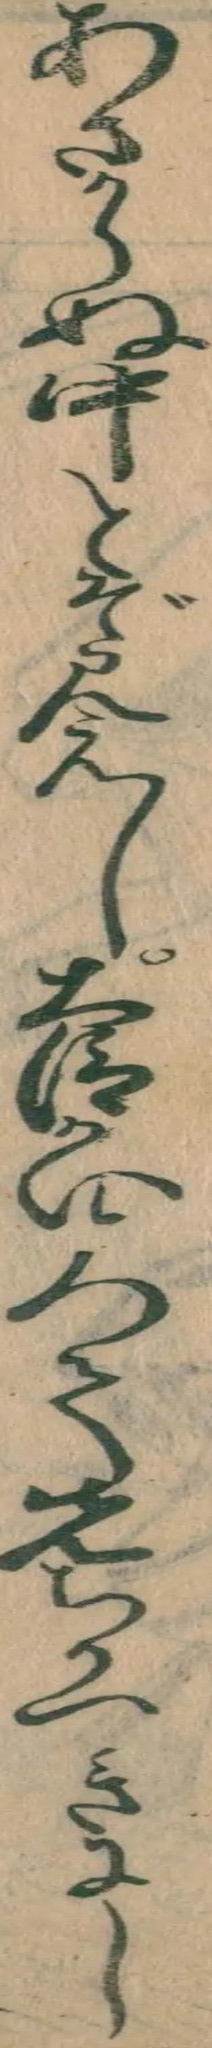あさからぬ中とぞ見えし。大臣かいとつて先ちかつきにし
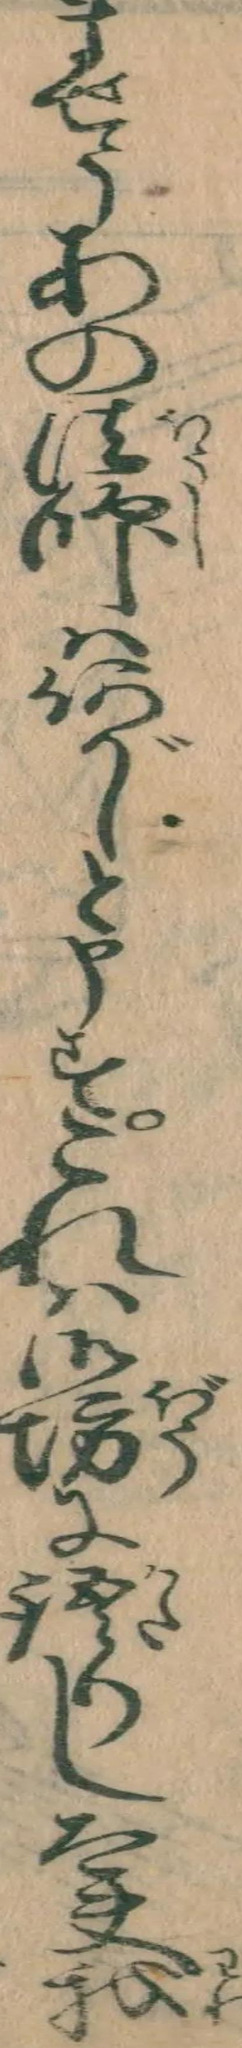ませうあの法師は何がしと申す。これは御坊に語りし太夫我
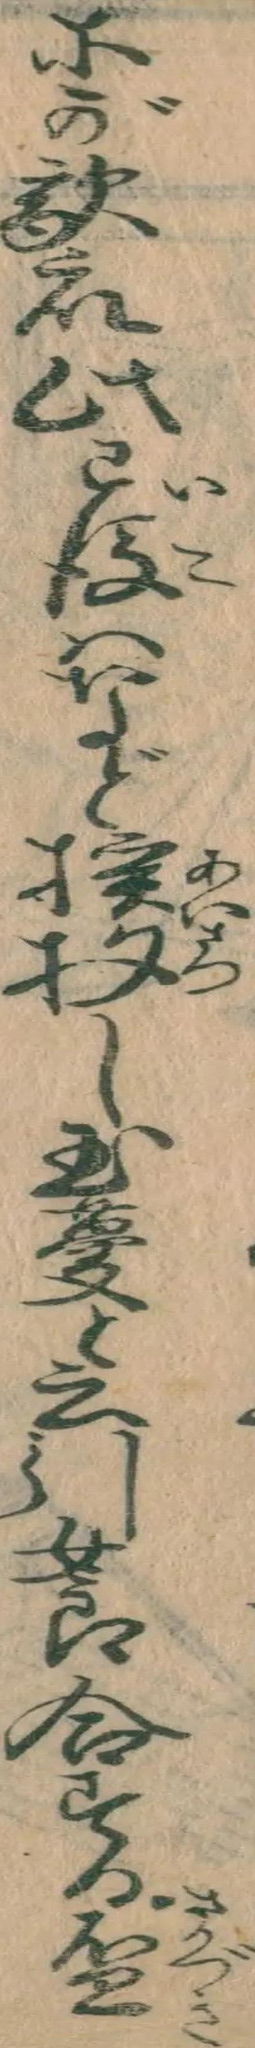等が敵衆此已後はなど挨拶し玉蔓と云引女郎合する杯
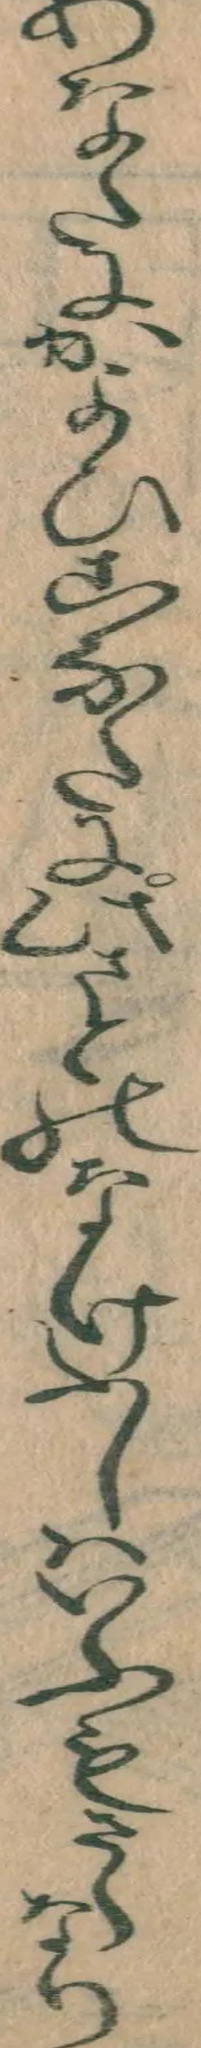あなたにかよひこなたに。此さとのなけふしはいふもさらなり
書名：新竹斎 5巻
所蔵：国立国会図書館 National Diet Library, JAPAN
